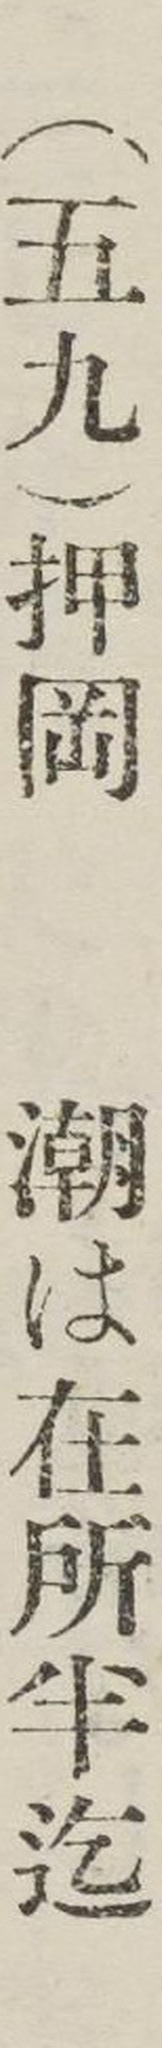押岡潮は在所半迄
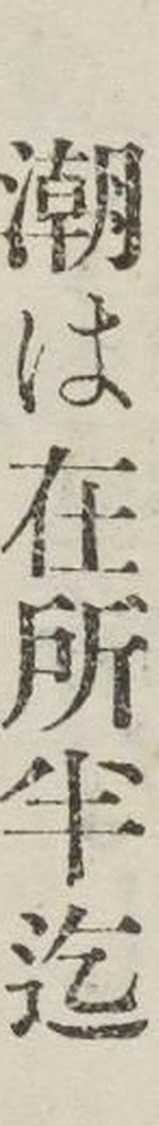押岡潮は在所半迄
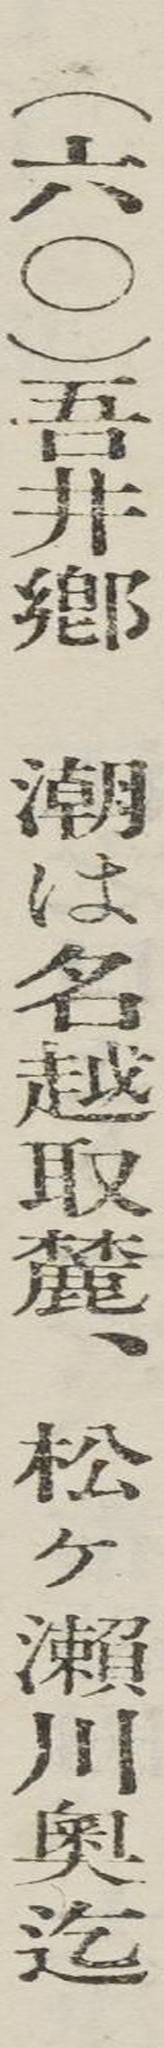吾井郷潮は名越取麓、松ヶ瀬川奥迄
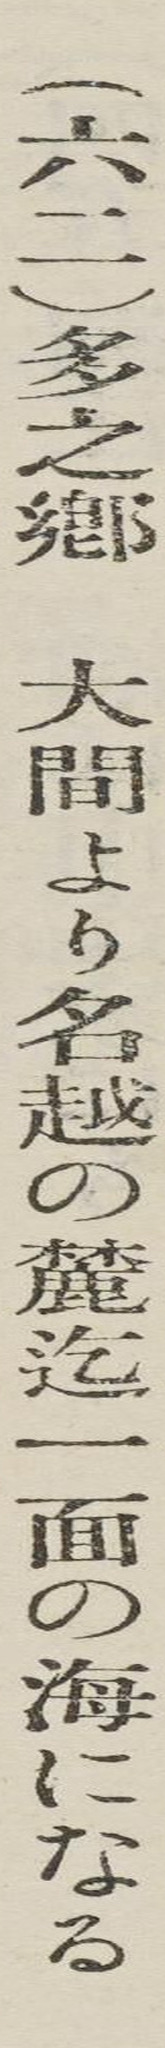多之郷大間より名越の麓迄一面の海になる
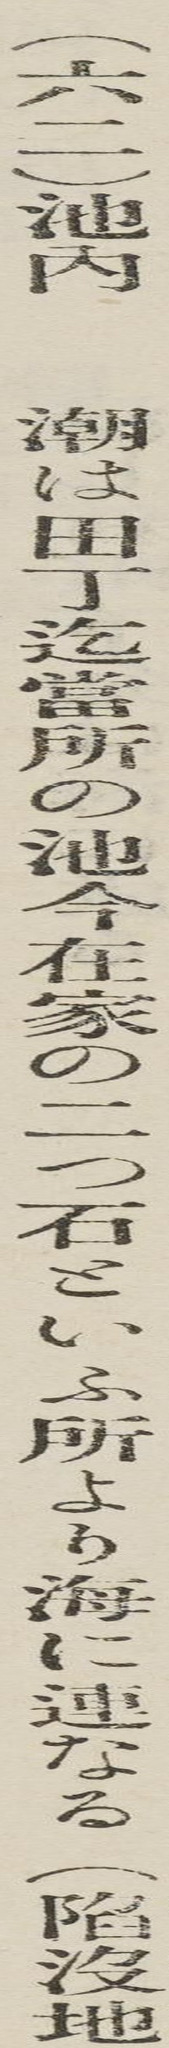池内潮は田丁迄当所の池今在家の二つ石といふ所より海に連なる
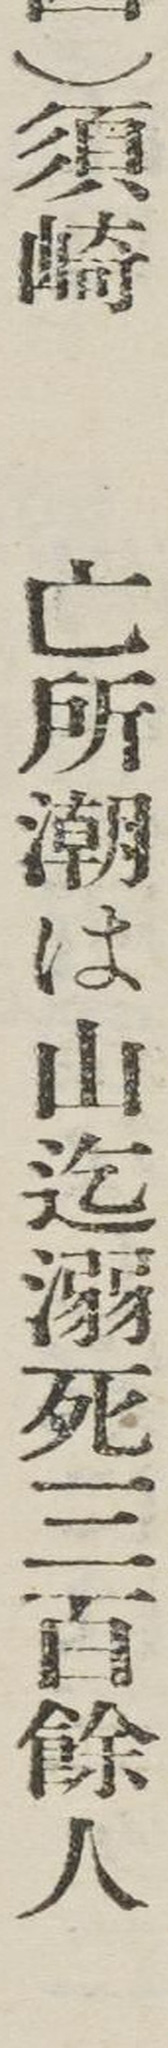須崎亡所潮は山迄溺死三百余人
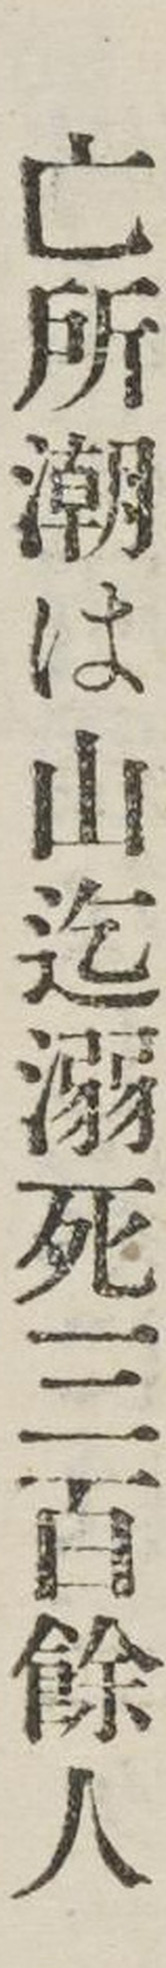須崎亡所潮は山迄溺死三百余人
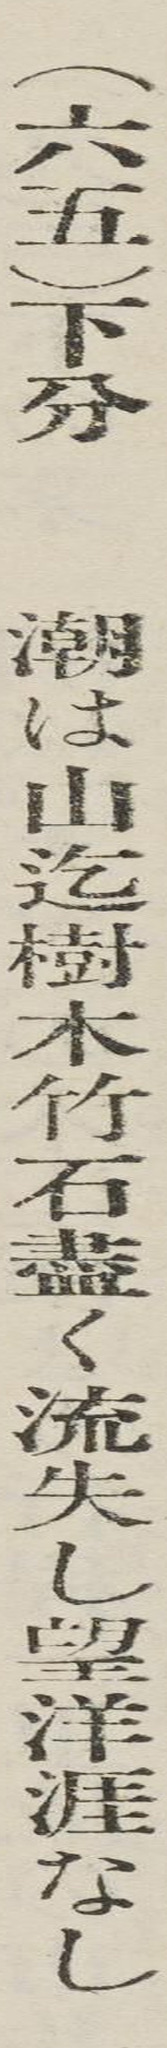下分潮は山迄樹木竹石尽く流失し望洋涯なし
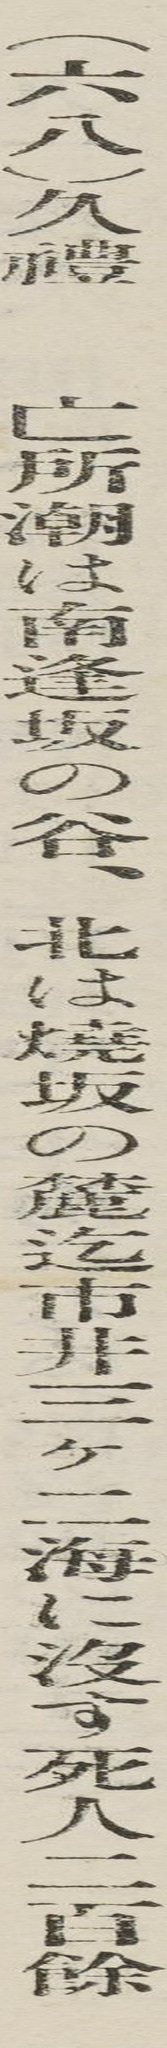久礼亡所潮は南逢坂の谷、北は焼坂の麓迄市井三ヶ二海に没す死人二百余
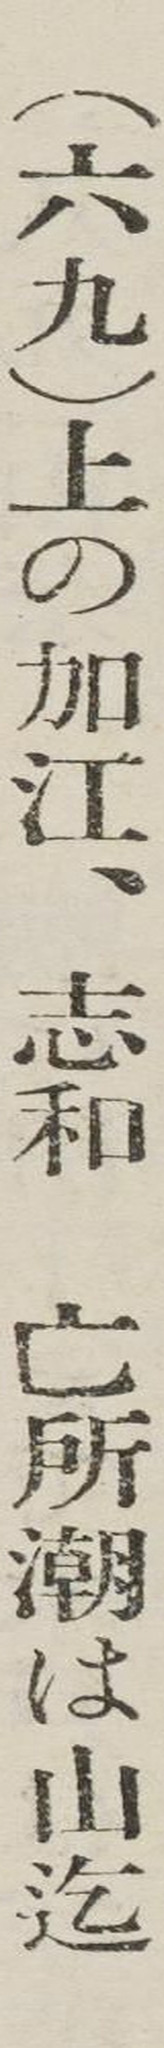上の加江、志和亡所潮は山迄
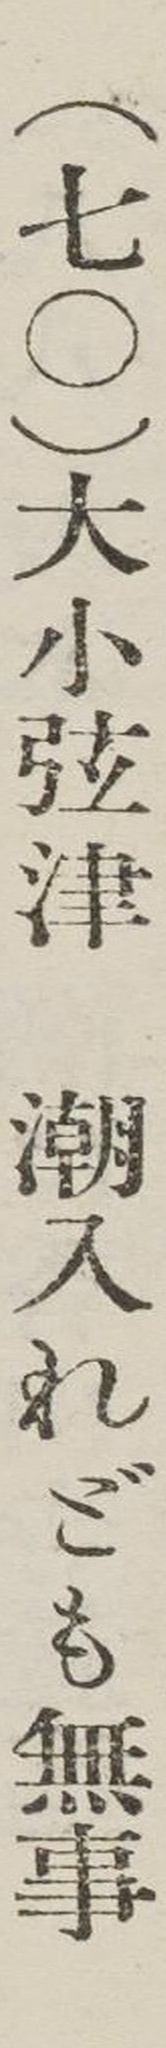大小弦津潮入れども無事
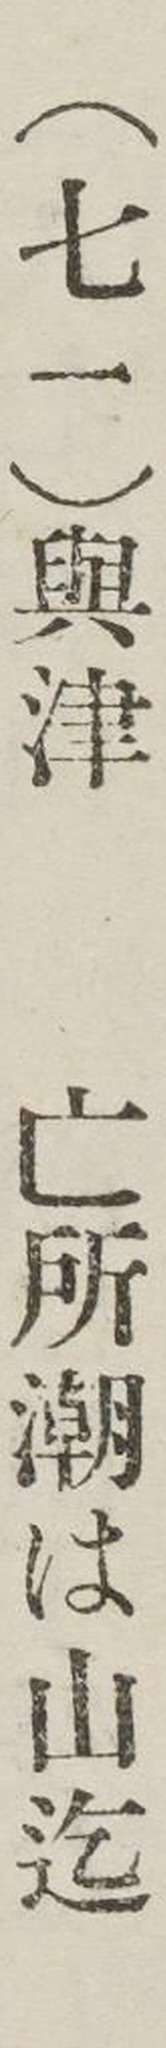与津亡所潮は山迄
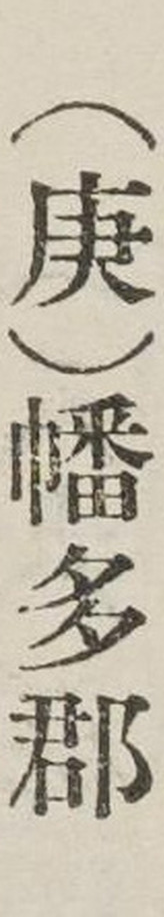幡多郡
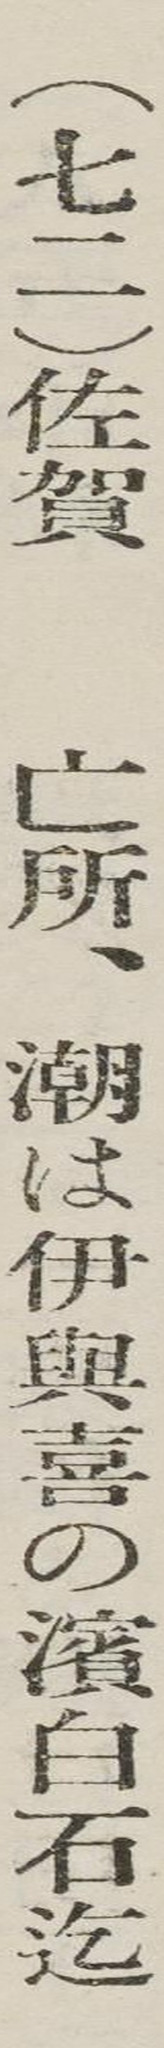佐賀亡所、潮は伊与喜の浜白石迄
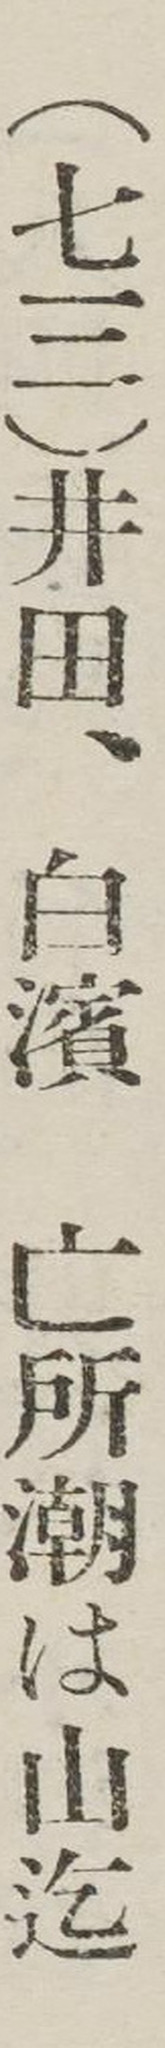井田、白浜亡所潮は山迄
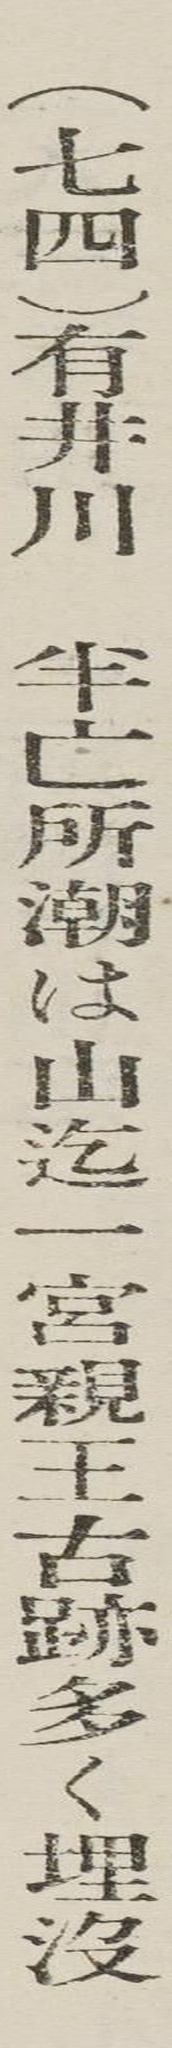有井川半亡所潮は山迄一宮親王古跡多く埋没
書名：土佐古今ノ地震
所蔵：東京大学地震研究所図書室 Earthquake Research Institute Library, The University of Tokyo, JAPAN
